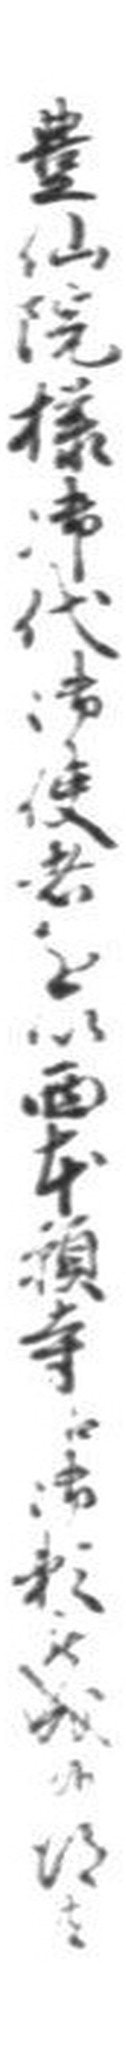豊仙院様御代御使者を以西本願寺江御頼被成候得共
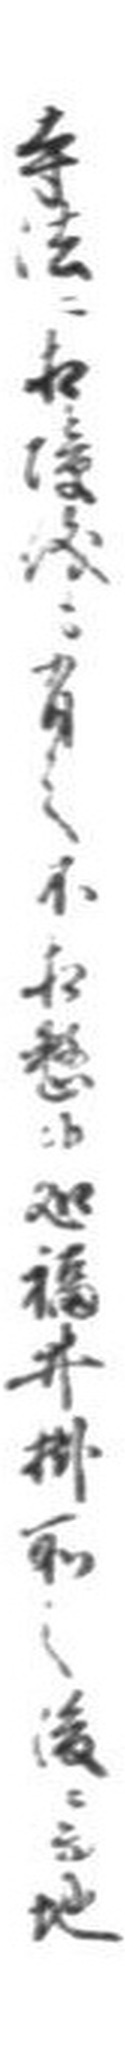寺法ニ相障儀も有之不相整候処福井掛所之後ニ而地
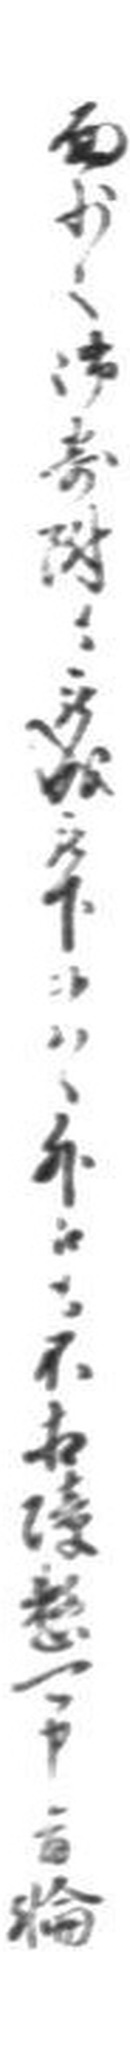面少々御寄附も被成被下候ハゝ外江も不相障整可申旨輪
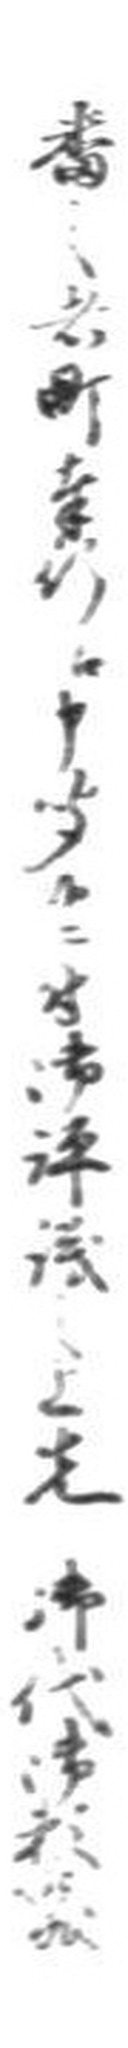番之者町奉行江申聞候ニ付御評議之上先御代御頼被成
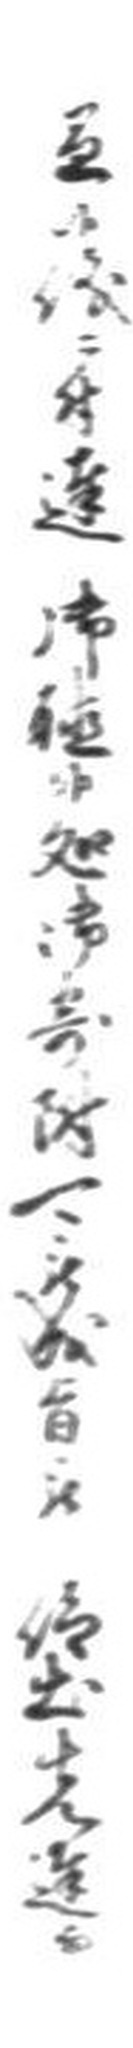置候儀ニ付達御聴候処御寄附可被成旨被仰出先達而
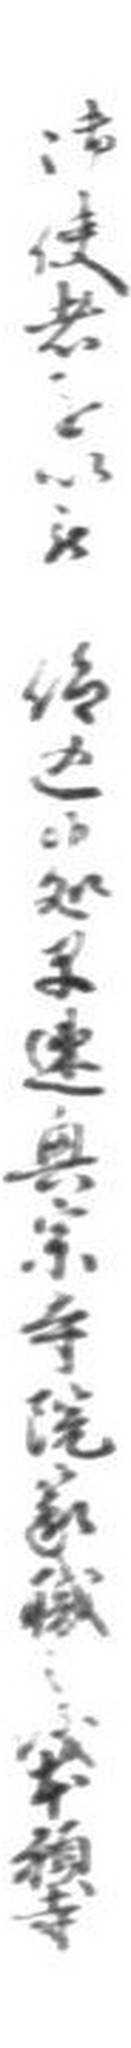御使者を以被仰込候処早速興宗寺院家職之儀本願寺
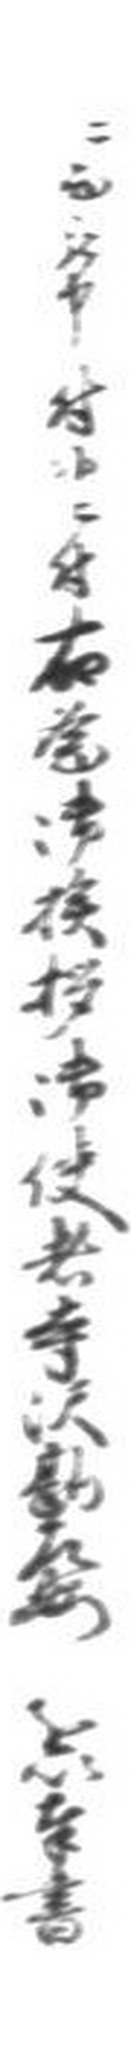ニ而被申付候ニ付右為御挨拶御使者寺沢勘左衛門を以奉書
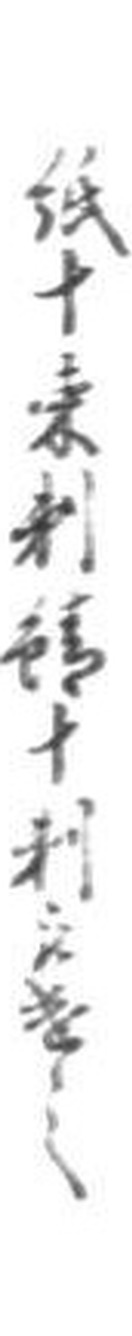紙十束刺鯖十刺被遣之
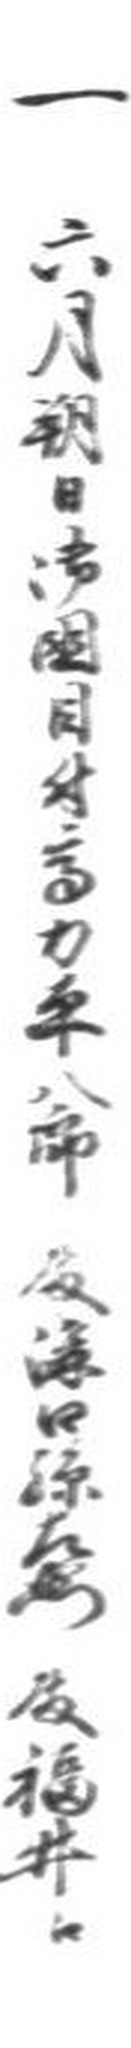一六月朔日御国目付高力平八郎殿溝口弥左衛門殿福井江
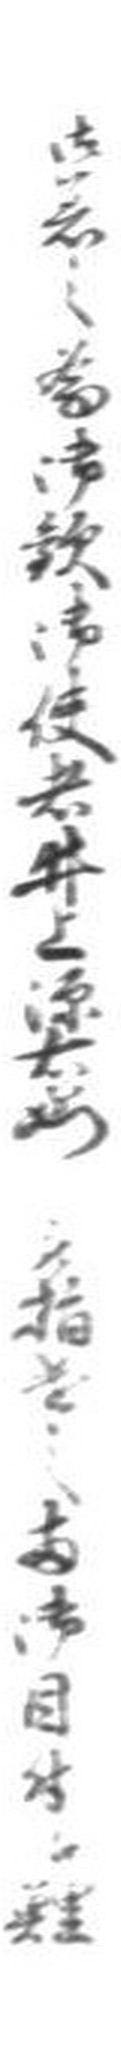御着之為御歓御使者井上源右衛門被指遣之両御目付江鯉
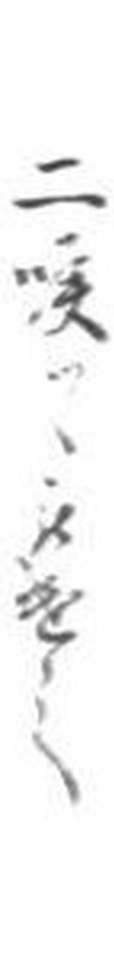二喉ツゝ被遣之

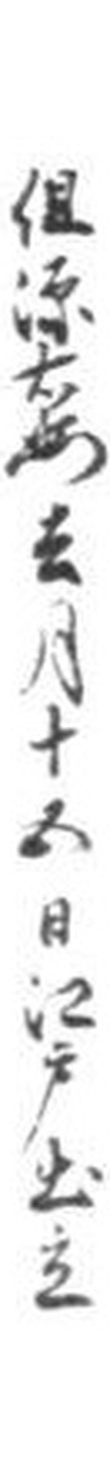但源右衛門去月十五日江戸出立
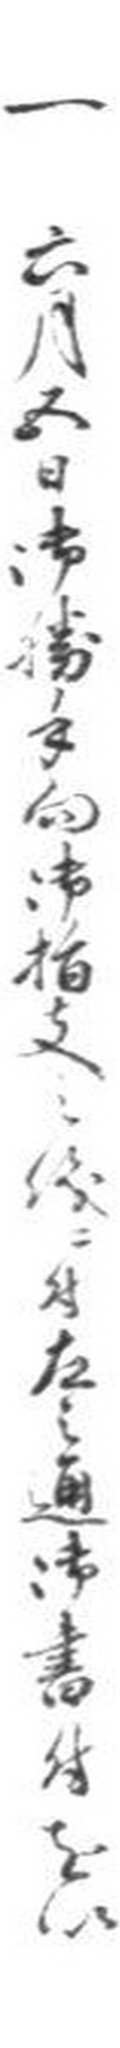一六月五日御勝手向御指支之儀ニ付左之通御書付を以
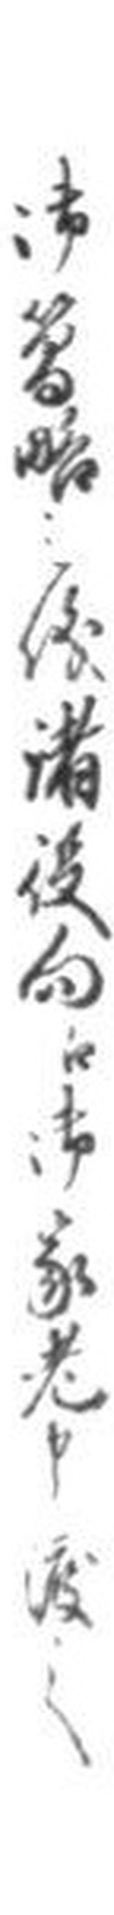御簡略之儀諸役向江御家老申渡之
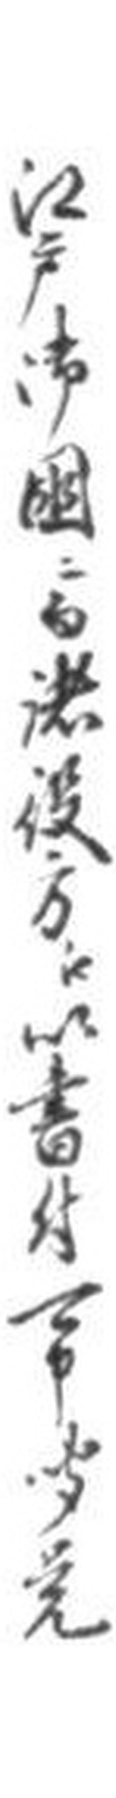江戸御国ニ而諸役方江以書付可申聞覚
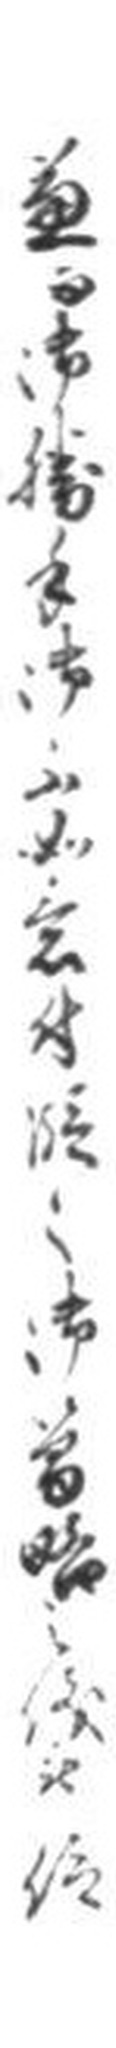兼而御勝手御不如意付段々御簡略之儀被仰
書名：家譜 三十九 宗矩公 享保十年
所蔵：福井県文書館 Fukui Prefectural Archives
